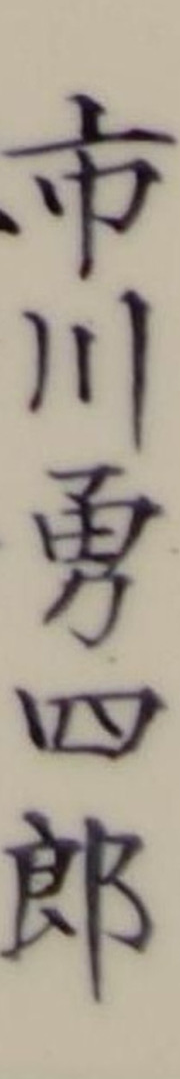市川勇四郎
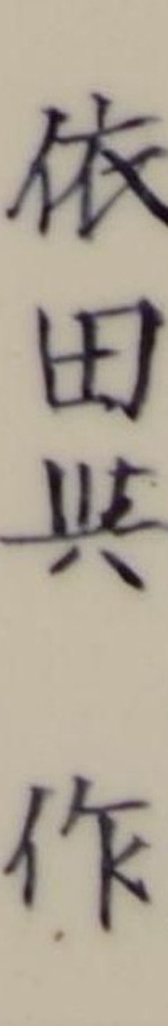依田與作
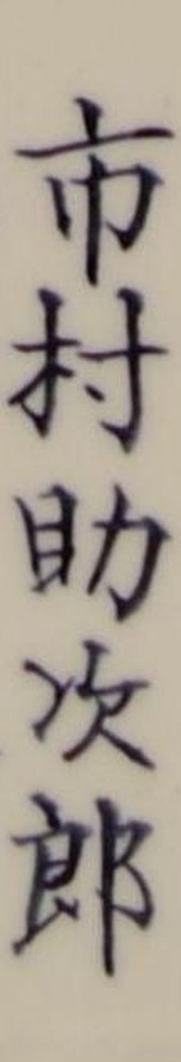市村助次郎
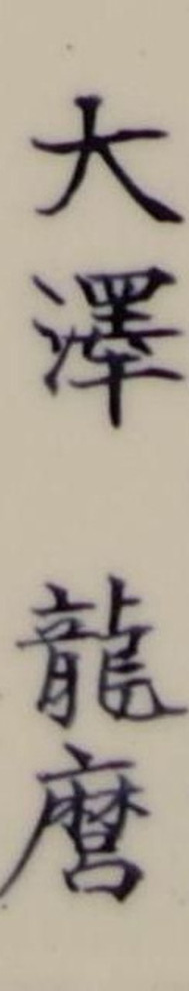大澤龍麿
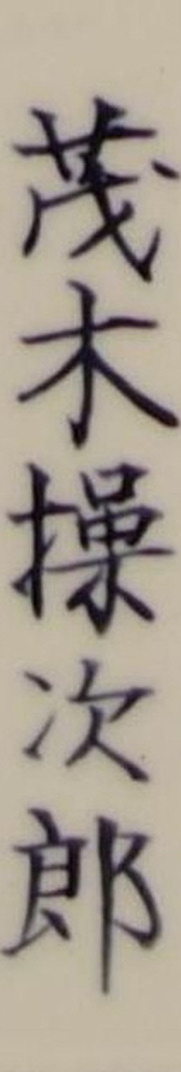茂木操次郎
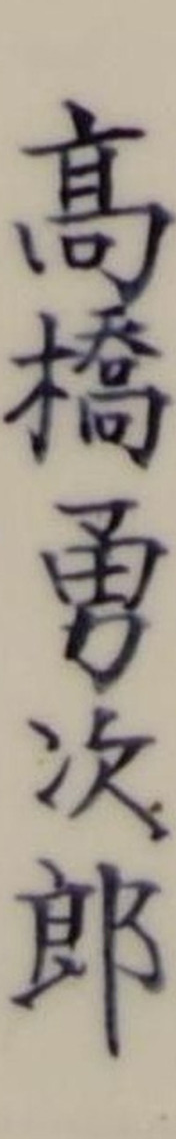高橋勇次郎
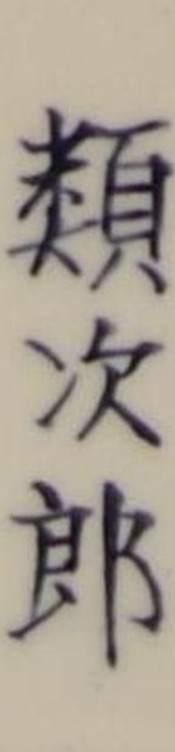類次郎
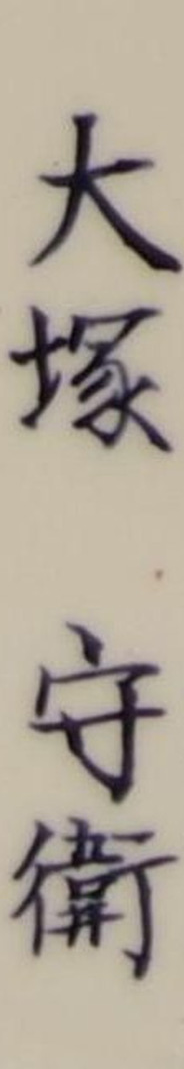大塚守衛
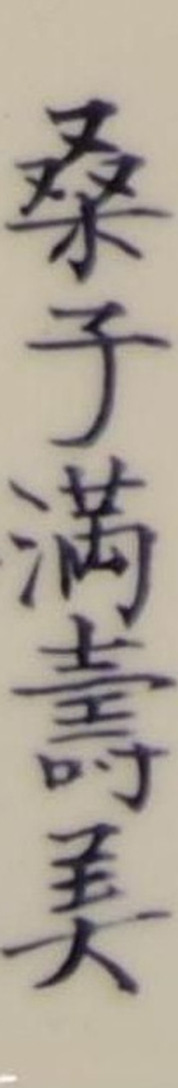桑子満寿美
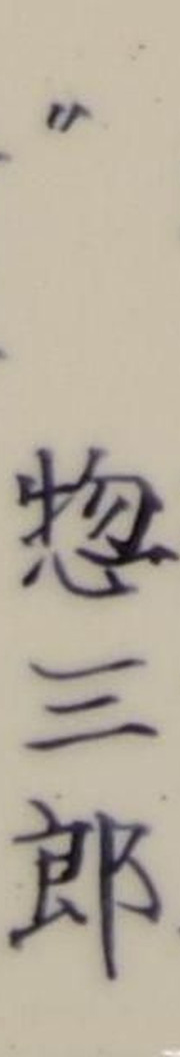惣三郎
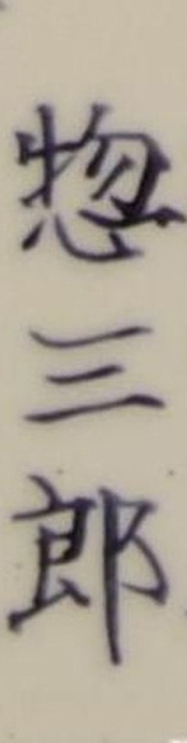惣三郎
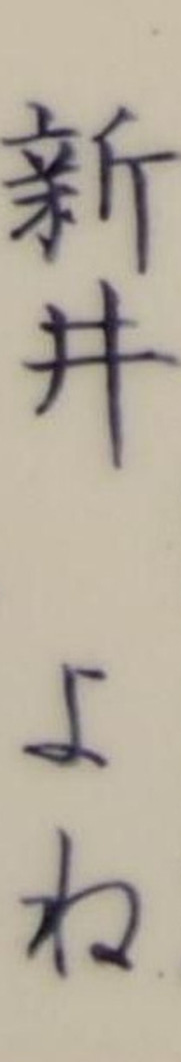新井よね
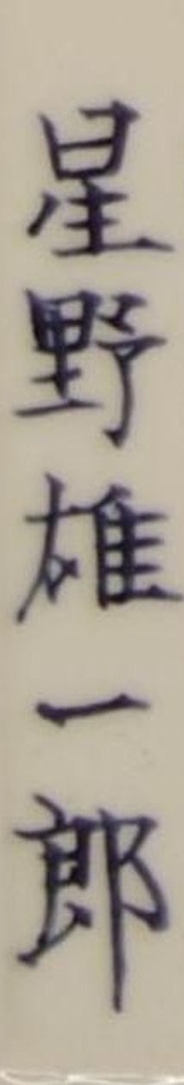星野雄一郎

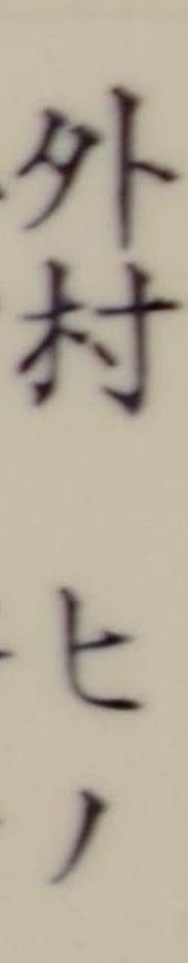外村ヒノ
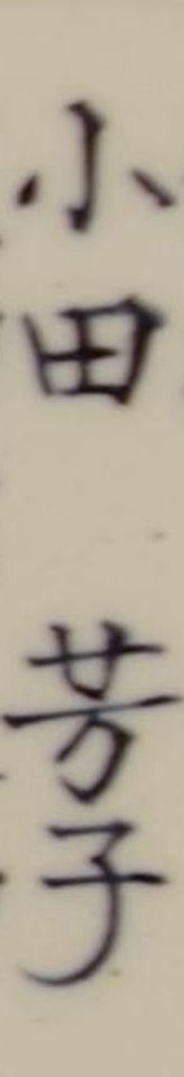小田芳子
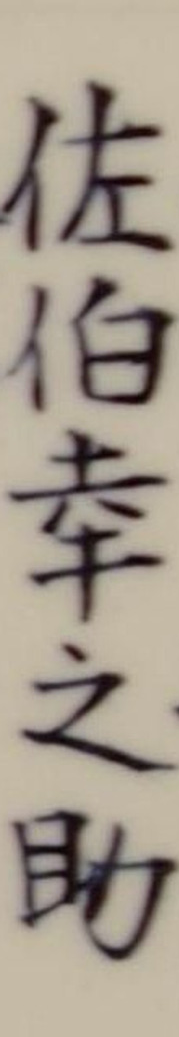佐伯幸之助
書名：E~L
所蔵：高野山金剛峯寺
